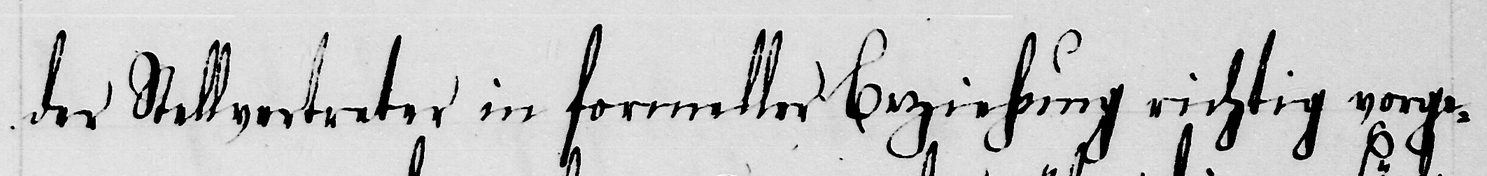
der Stellvertreter in formeller Beziehung richtig vorge¬
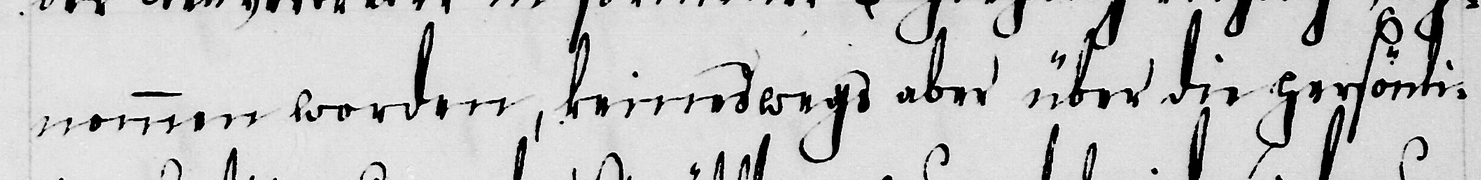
nommen worden, keineswegs aber über die persönli¬
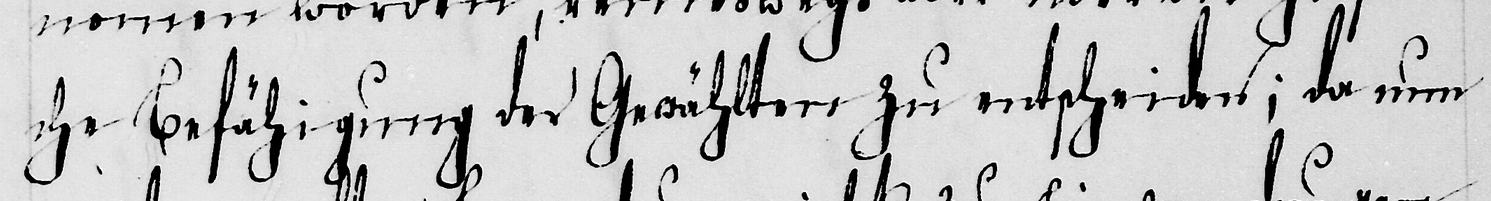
che Befähigung der Gewählten zu entscheiden; da nun
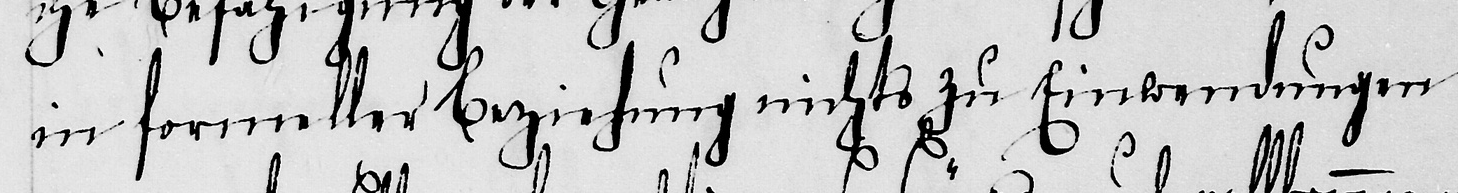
in formeller Beziehung nichts zu Einwendungen
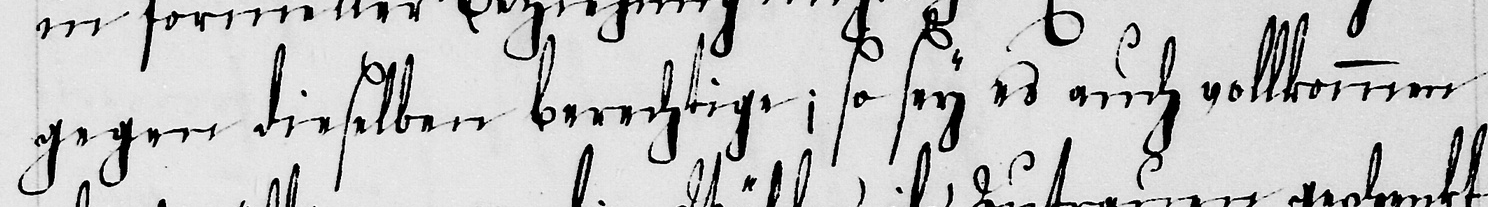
gegen dieselben berechtige; so sey es auch vollkommen
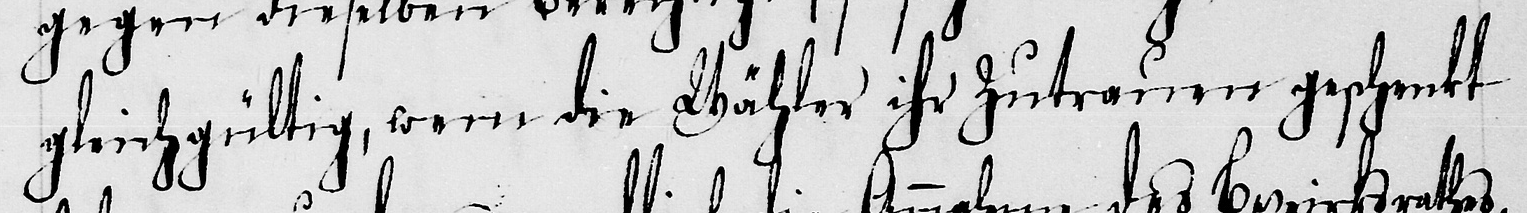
gleichgültig, wem die Wähler ihr Zutrauen geschenkt
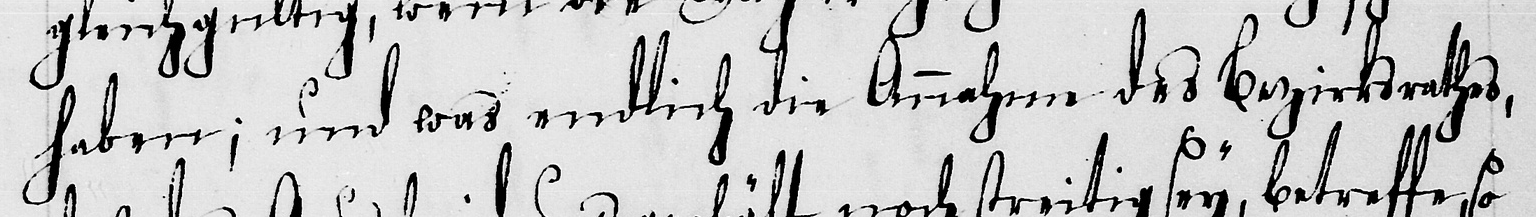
haben; und was endlich die Annahme des Bezirksrathes,
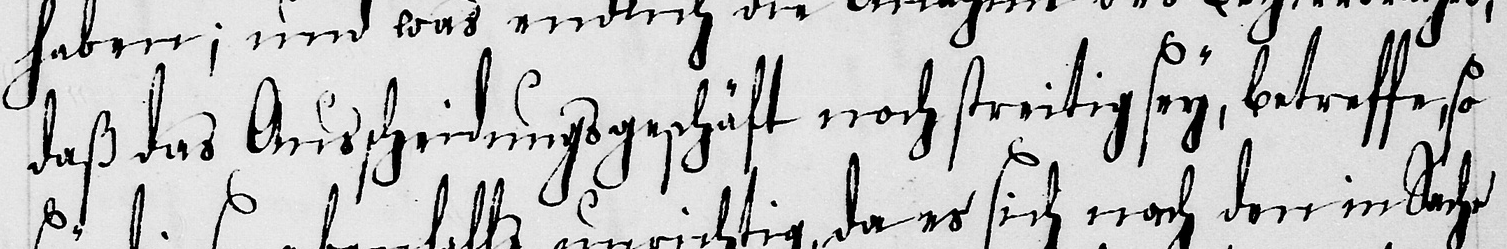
daß das Ausscheidungsgeschäft noch streitig sey, betreffe,
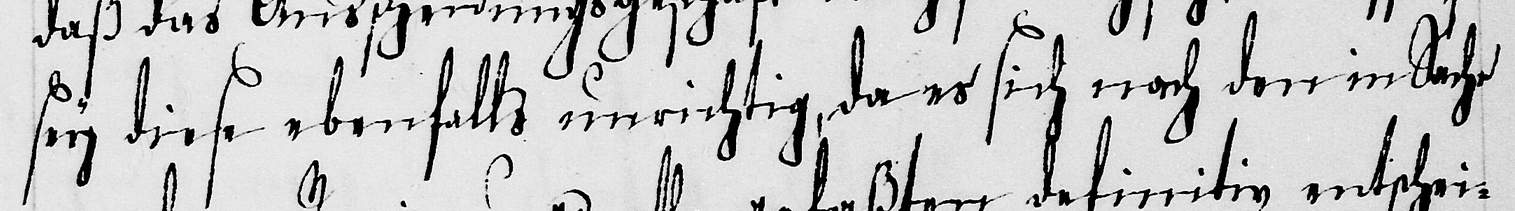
sey diese ebenfalls unrichtig, da es sich nach den in Sache
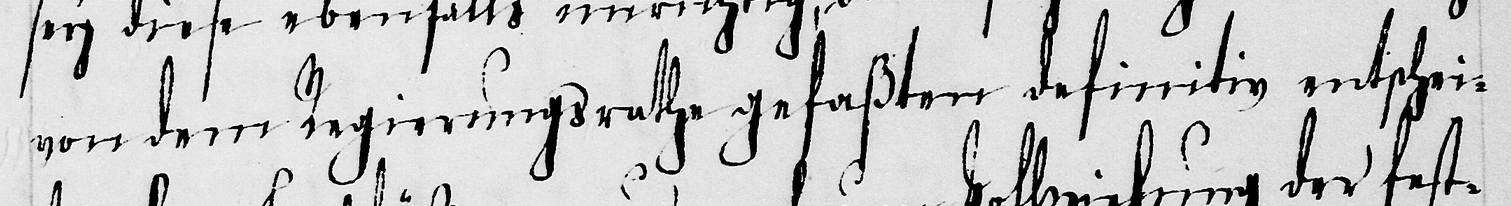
von dem Regierungsrathe gefaßten definitiv entschei¬
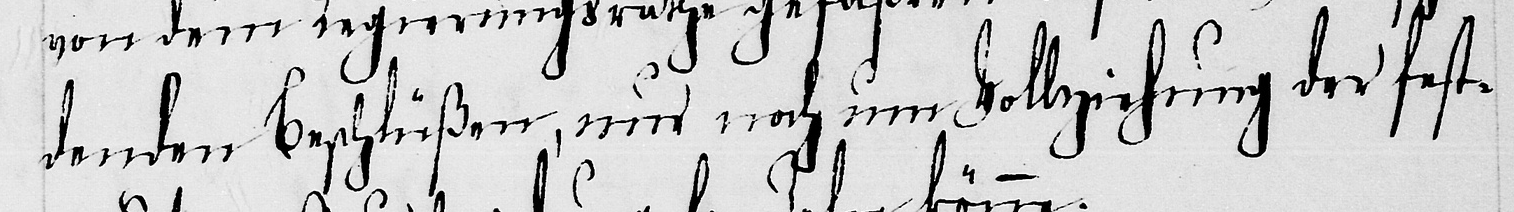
denden Beschlüßen, nur noch um Vollziehung der fest¬
